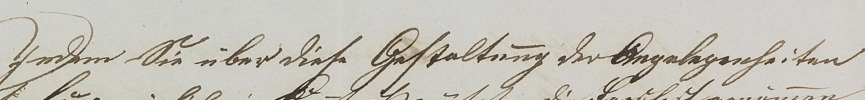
Indem Sie über diese Gestaltung der Angelegenheiten
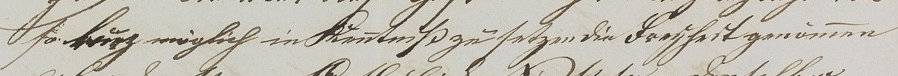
so kurz möglich in Kenntniß zu setzen die Freyheit genommen
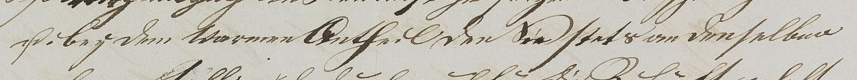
&. bey dem warmen Antheil den Sie stets an demselben
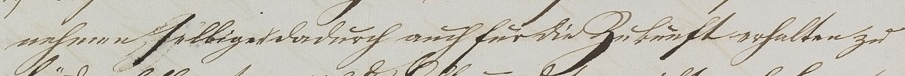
nahmen, selbigen dadurch auch für die Zukunft erhalten zu
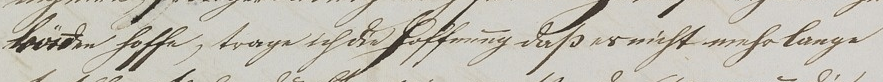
können hoffe, trage ich die Hoffnung daß es nicht mehr lange
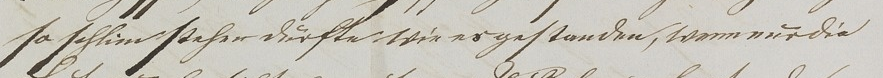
so schlim stehen dürfte wie es gestanden, wenn nur die
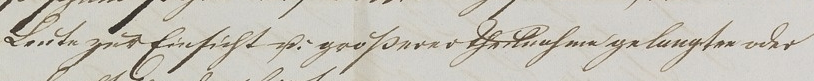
Leute zur Einsicht &: grösserer Theilnahme gelangten oder
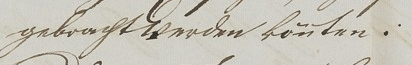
gebracht werden könnten.
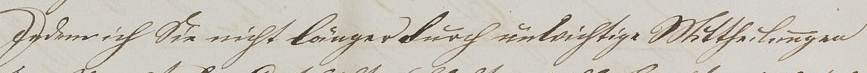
Indem ich Sie nicht länger durch unwichtige Mittheilungen
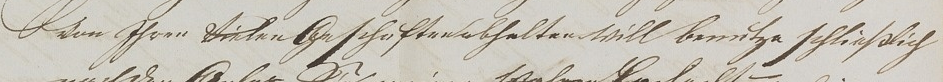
von Ihren vielen Geschäften abhalten will benutze schließlich
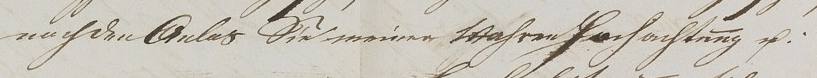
noch den Anlas Sie meiner wahren Hochachtung &:
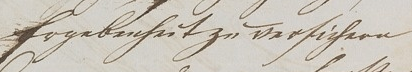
Ergebenheit zu versichern.
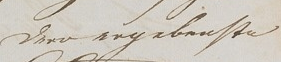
Dero Ergebenste
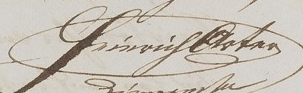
Heinrich Arter
